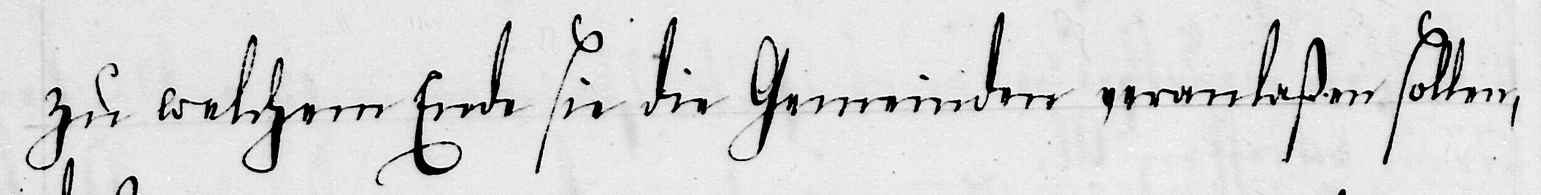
zu welchem Ende sie die Gemeinden veranlaßen solle¬
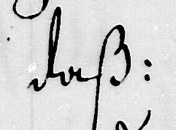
daß:
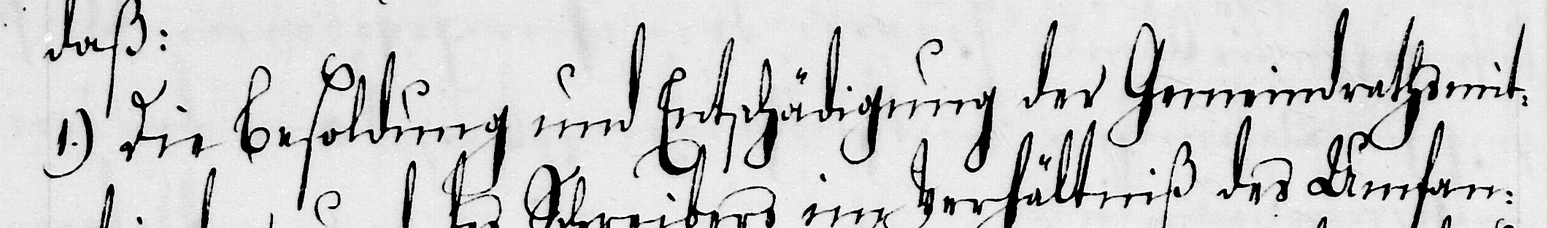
1.) Die Besoldung und Entschädigung der Gemeinderathsmit¬
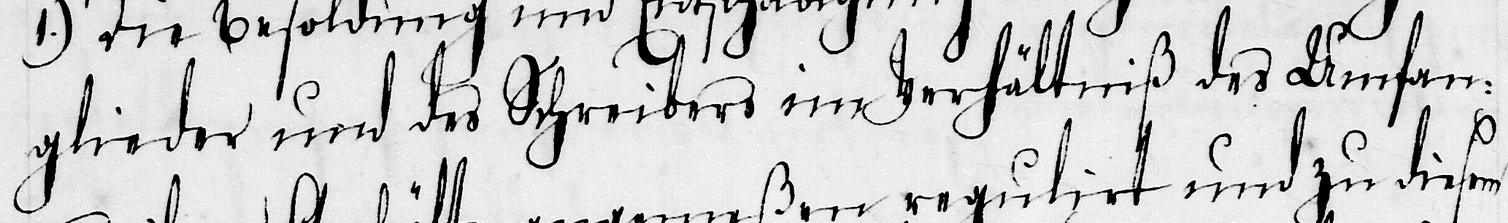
glieder und des Schreibers im Verhältniß des Umfan¬
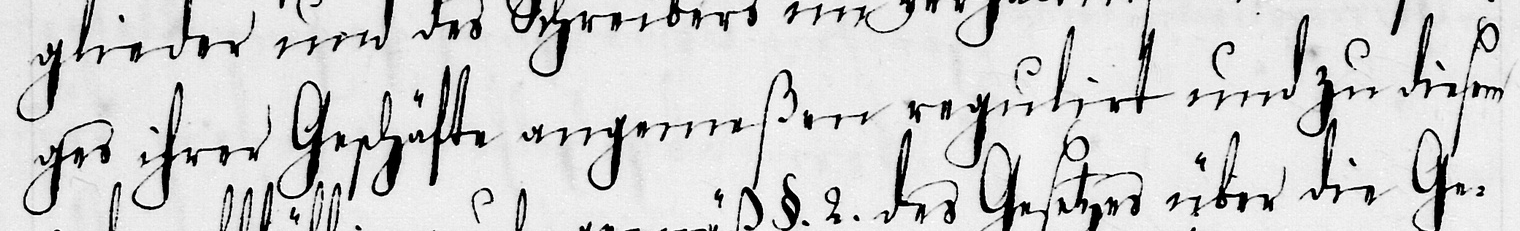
ges ihrer Geschäfte angemeßen regulirt und zu diesem
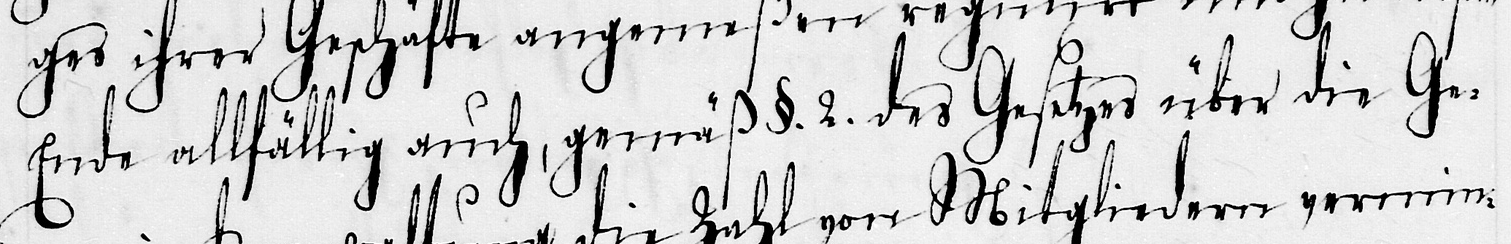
Ende allfällig auch, gemäß §. 2. des Gesetzes über die Ge¬
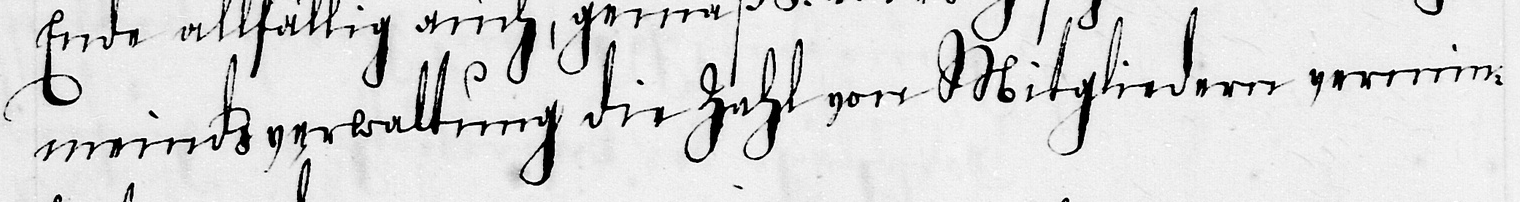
meindsverwaltung die Zahl von Mitgliedern vermin¬
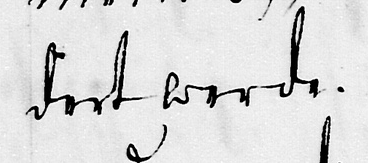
dert werde.
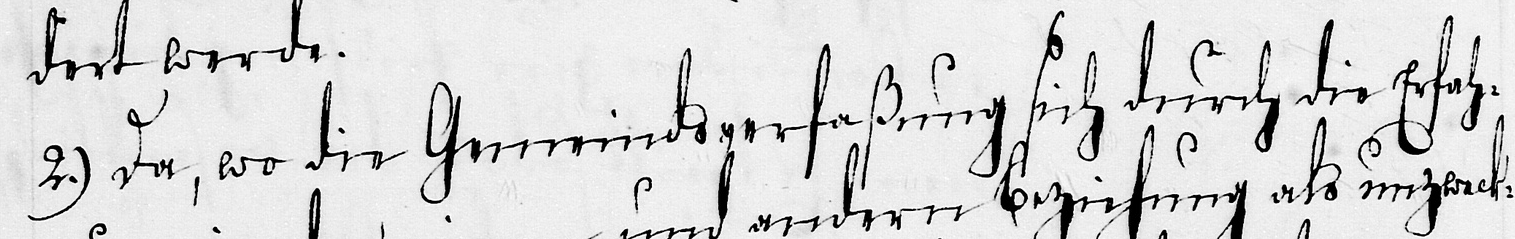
2.) Da, wo die Gemeindsverfaßung sich durch die Erfa¬
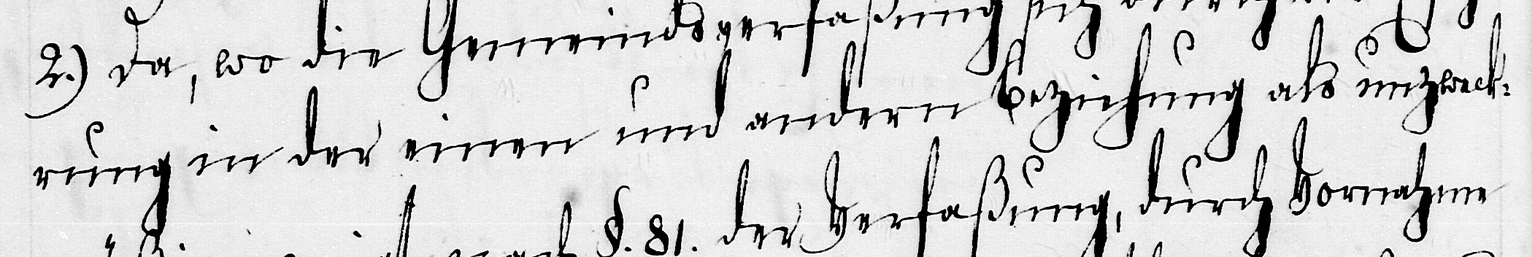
hrung in der einen und andern Beziehung als unzweck¬
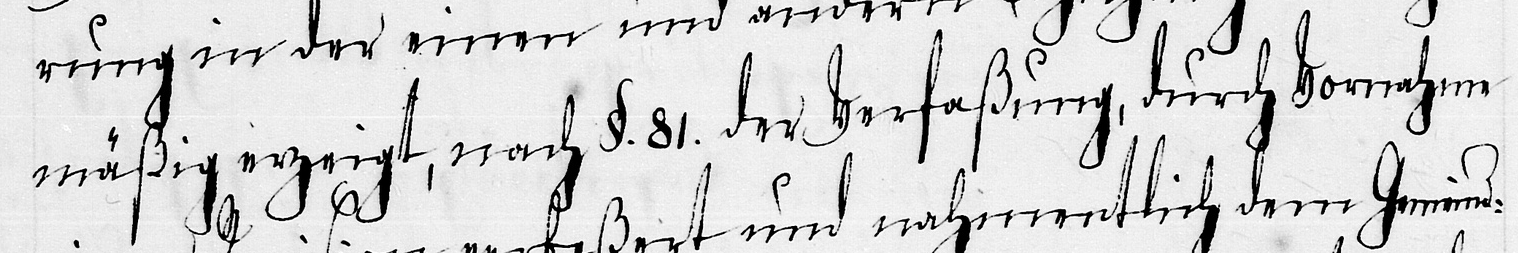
mäßig erzeigt, nach §. 81. der Verfaßung, durch Vornahme
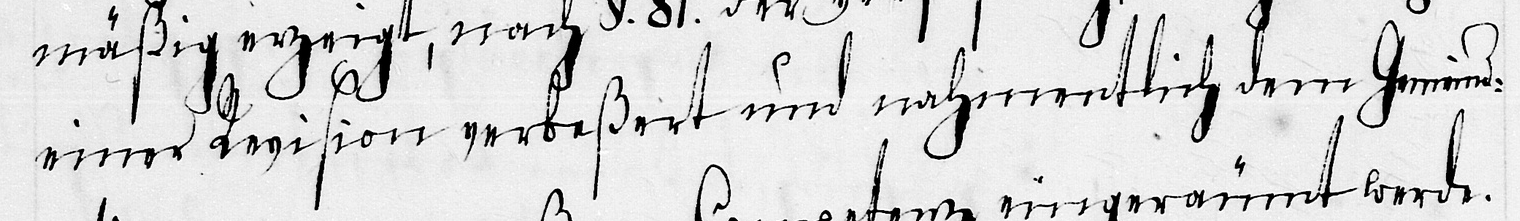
einer Revision verbeßert und nahmentlich dem Gemeind¬
